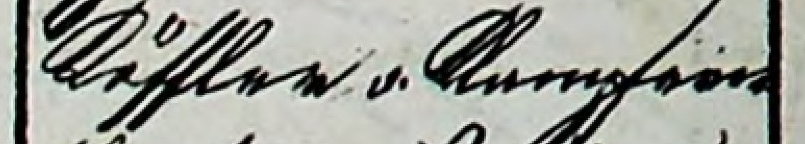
Kuffler v. Kampfern
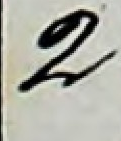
2
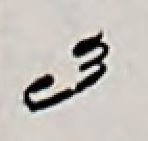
3
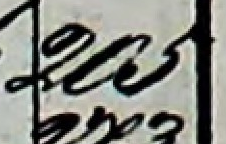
205
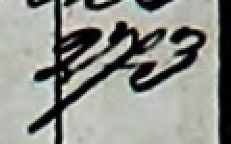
273
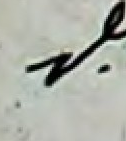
do
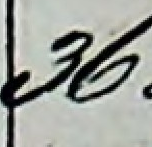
36
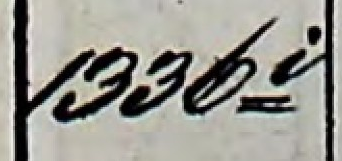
1336i
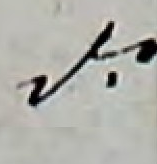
do
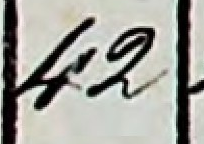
42
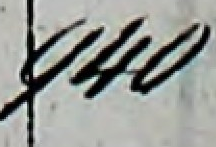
940
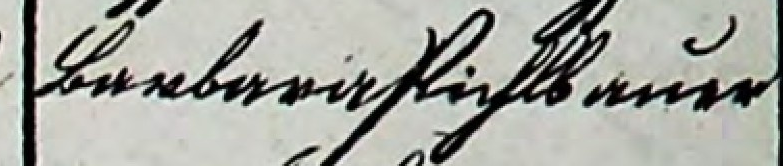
Barbara Richtsauer
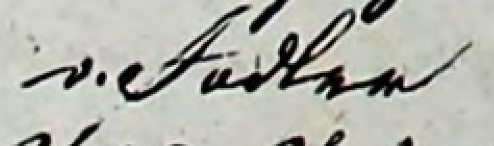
v. Fodler
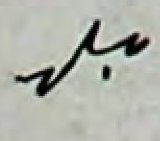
do
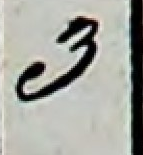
3
